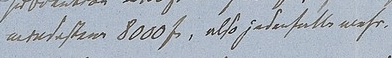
mindestens 8000 fs, also jedenfalls mehr.
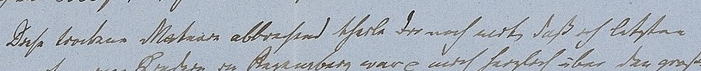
Diese trockne Materie abbrechend theile Dir noch mit, daß ich letzten
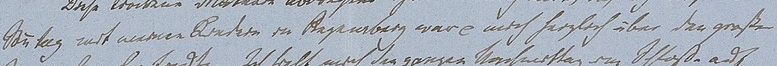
Sonntag mit meinen Kindern in Regensberg war & mich herzlich über den großen
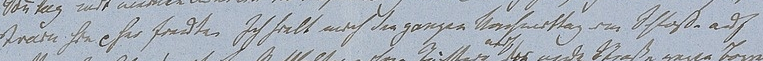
Train hin & her freute. Ich hielt mich den ganzen Nachmittag im Schlosse auf
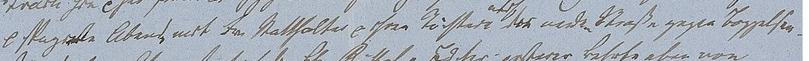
& spazirte Abends mit Fr. Statthalter & ihren Töchternauf der neuen Straße gegen Boppelsen
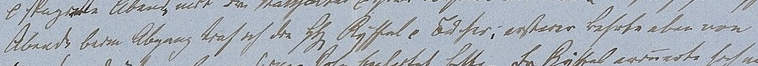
Abends beim Abgang traf ich die HHn. Ryffel & Bucher; ersterer kehrte eben von
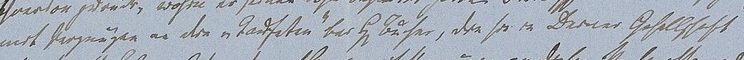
mit Vergnügen an die «Taufeten» bei Hrn Bucher, die sie in Deiner Gesellschaft
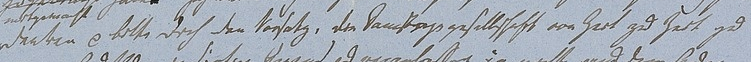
denken & bitte Dich den Vorsatz, die Samstagsgesellschaft von Zeit zu Zeit zu
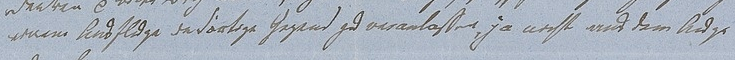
einem Ausfluge in dortige Gegend zu veranlassen, ja nicht aus dem Auge
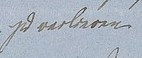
zu verlieren.
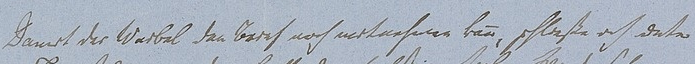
Damit der Weibel den Brief noch mithemen kann, schließe ich unter
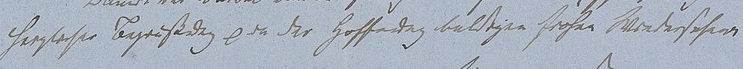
herzlicher Begrüßung & in der Hoffnung baldigen frohen Wiedersehens
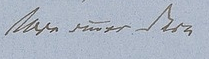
Wie immer dein
